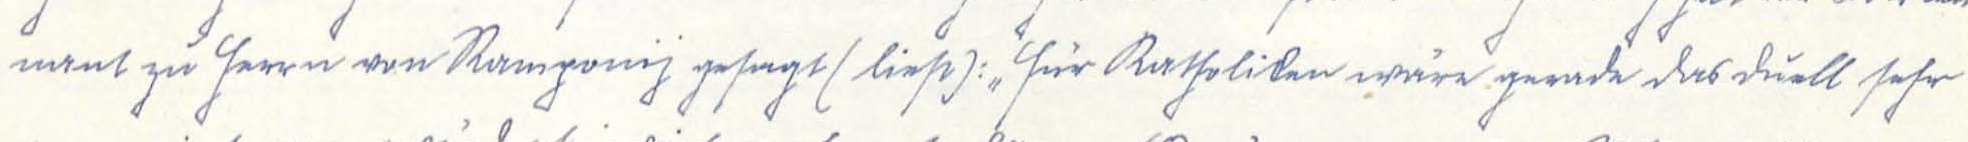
nant zu Herrn von Ramponij gesagt ( liest ): "Für Katholiken wäre gerade das Duell sehr
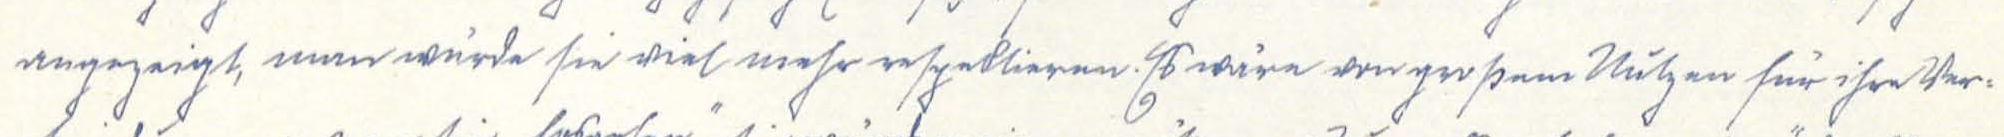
angzeigt, man würde sie viel mehr respektieren. Es wäre von großem Nutzen für ihre Ver-
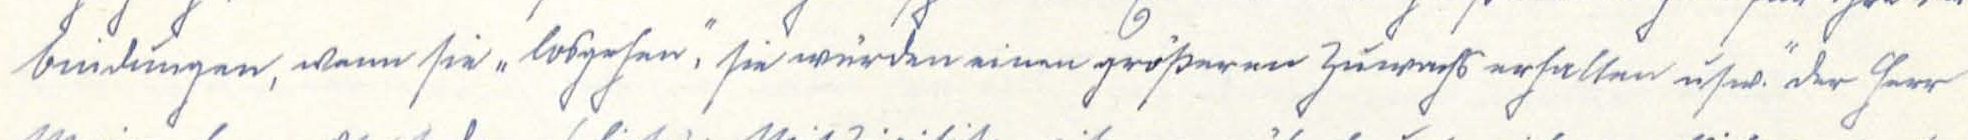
bindungen, wenn sie „losgehen", sie würden einen größeren Zuwachs erhalten usw. Der Herr
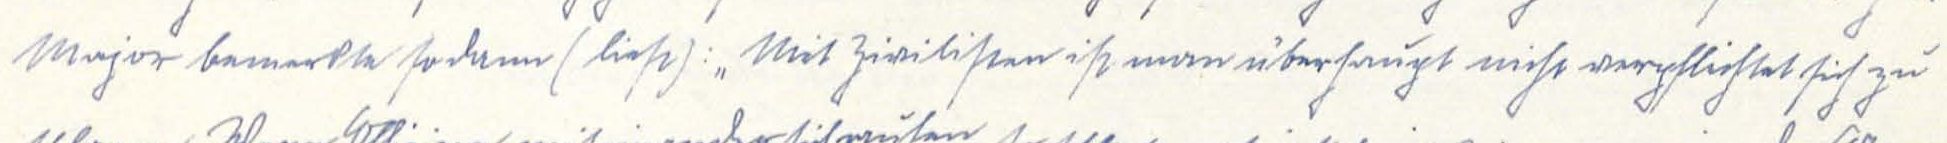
Major bemerkte sodann (liest): „Mit Zivilisten ist man überhaupt nicht verpflichtet sich zu
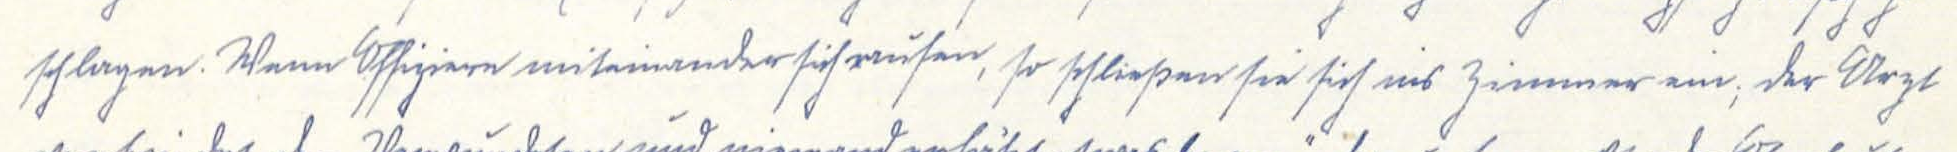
schlagen. Wenn Offiziere miteinander sich raufen, so schießen sie sich ins Zimmer ein; der Arzt
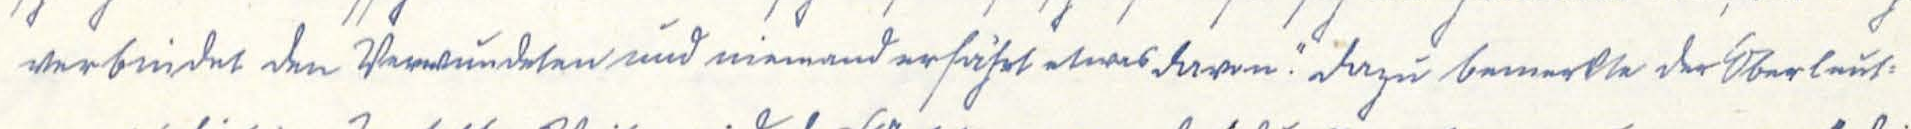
verbindet den Verwundeten und niemand erfährt etwas davon. Dazu bemerkte der Oberleut-
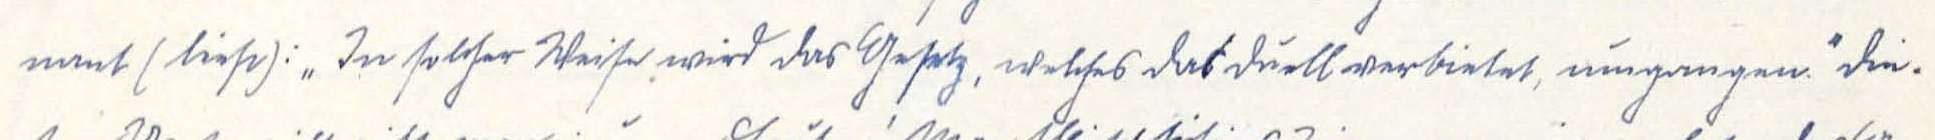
nant (liest): „In solcher Weise wird das Gesetz, welches das Duell verbietet, umgangen“ die-
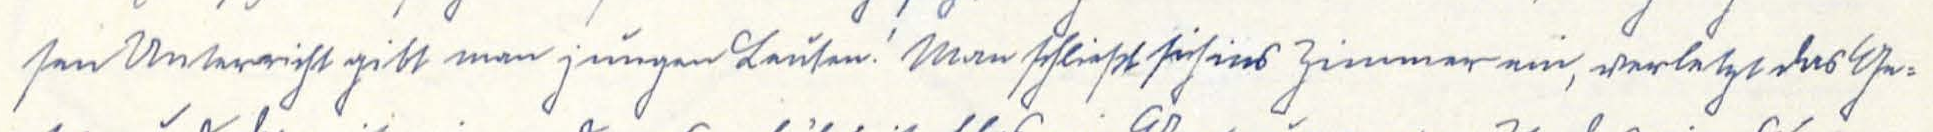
sen Unterricht gibt man jungen Leuten. Man schließt sich ins Zimmer ein, verletzt das Ge-
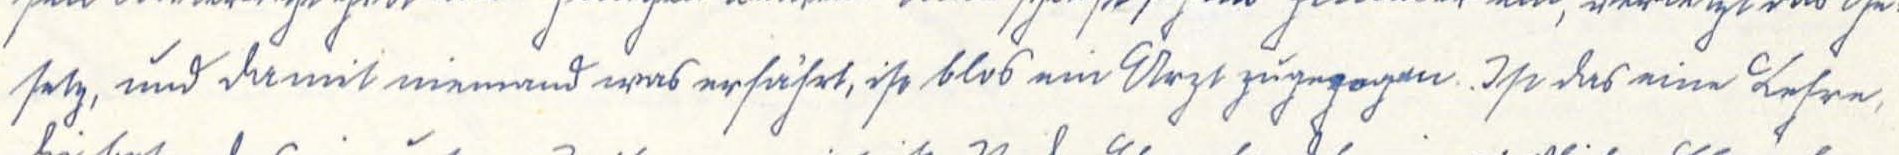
setz, und damit niemand was erfährt, ist blos ein Arzt zugegen. Ist das eine Lehre,
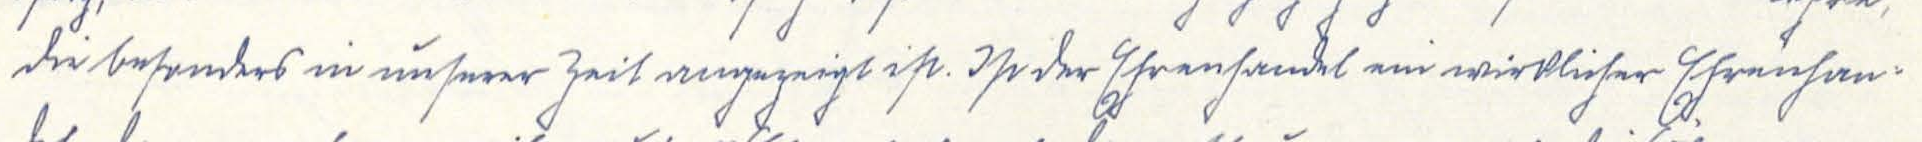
die besonders in unserer Zeit angezeigt ist. Ist der Ehrenhandel ein wirklicher Ehrenhan-
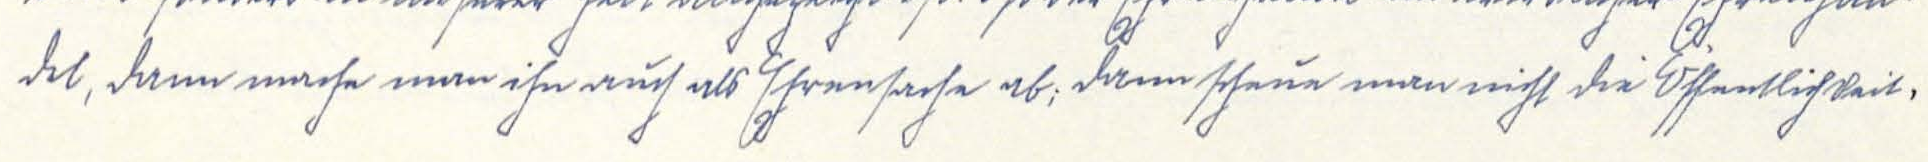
del, dann mache man ihn auch als Ehrensache ab, dann scheue man nicht die Öffentlichkeit,
